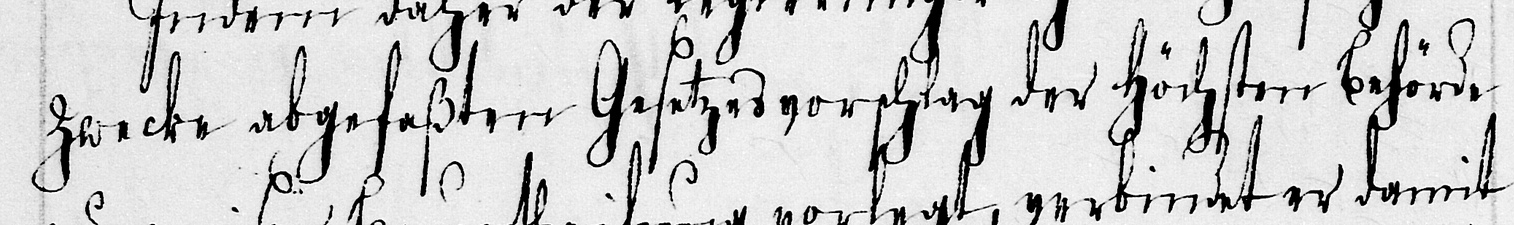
Zwecke abgefaßten Gesetzesvorschlag der Höchsten Behör¬
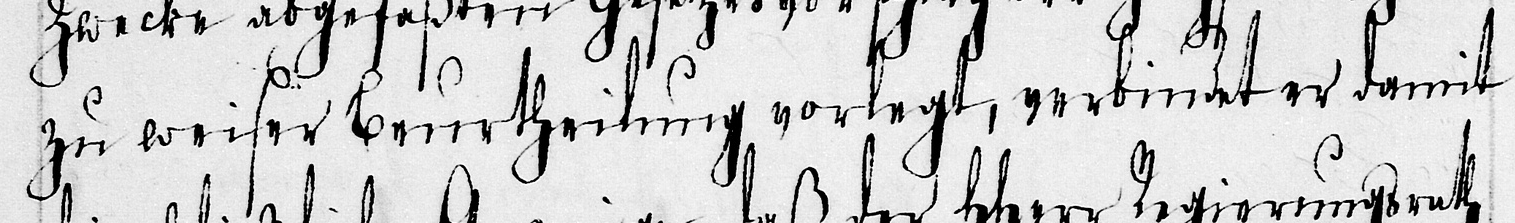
zu weiser Beurtheilung vorlegt, verbindet er damit
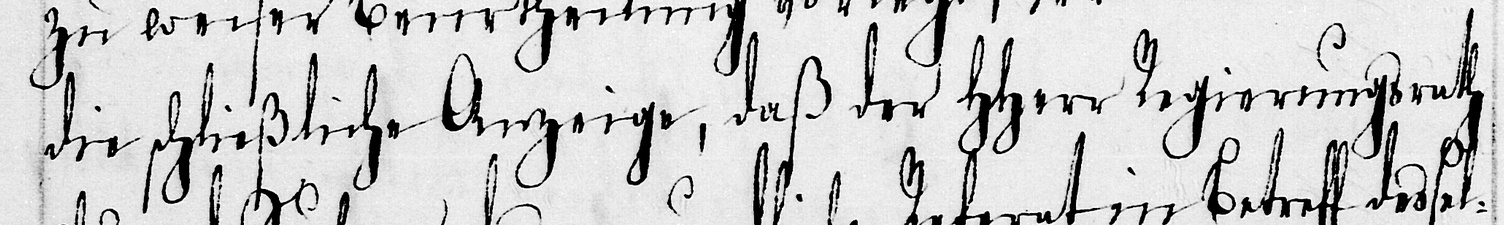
die schließliche Anzeige, daß der HHerr Regierungsrath
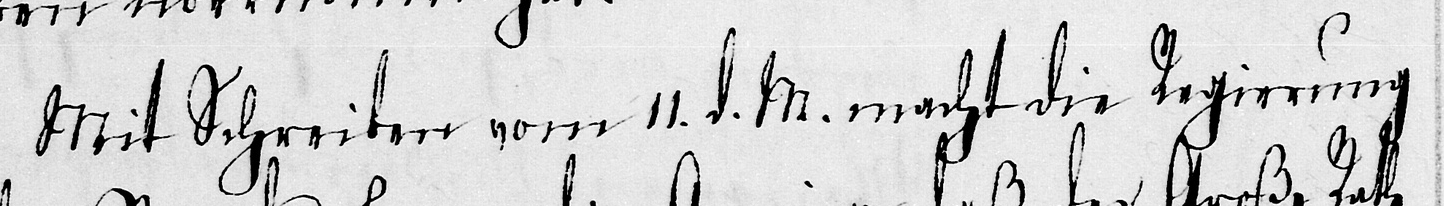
Mit Schreiben vom 11. d. M. macht die Regierung
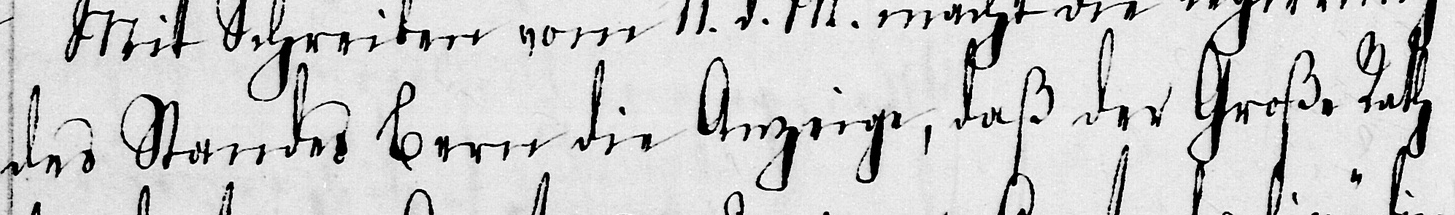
des Standes Bern die Anzeige, daß der Große Rath
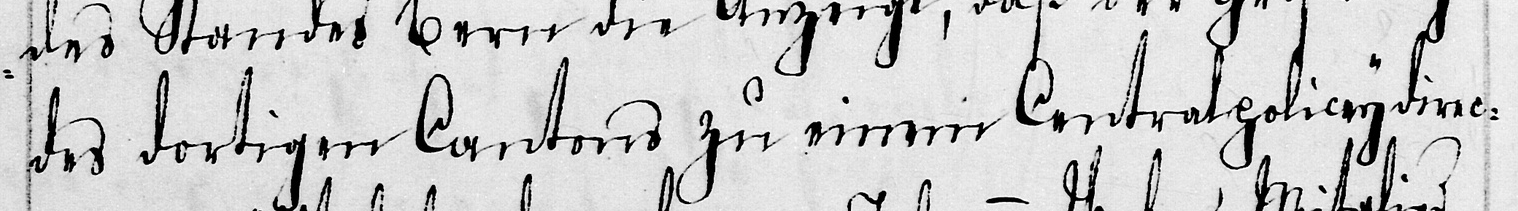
des dortigen Cantons zu einem Centralpoliceydirec¬
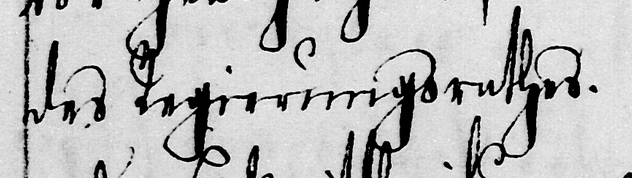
des Regierungsrathes.
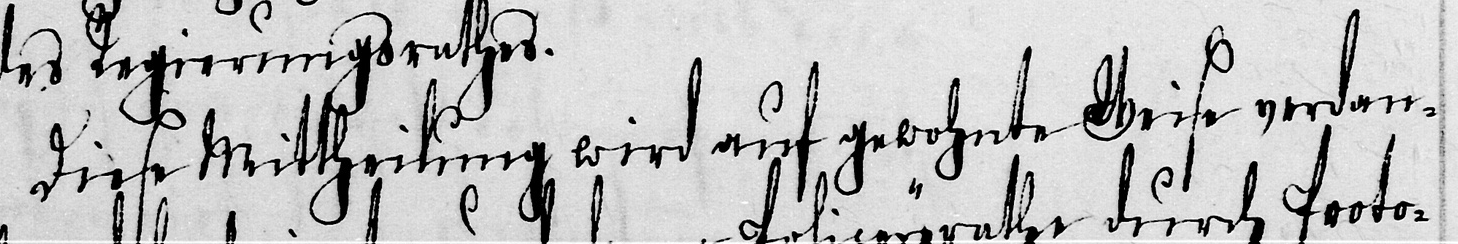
Diese Mittheilung wird auf gewohnte Weise verdan¬
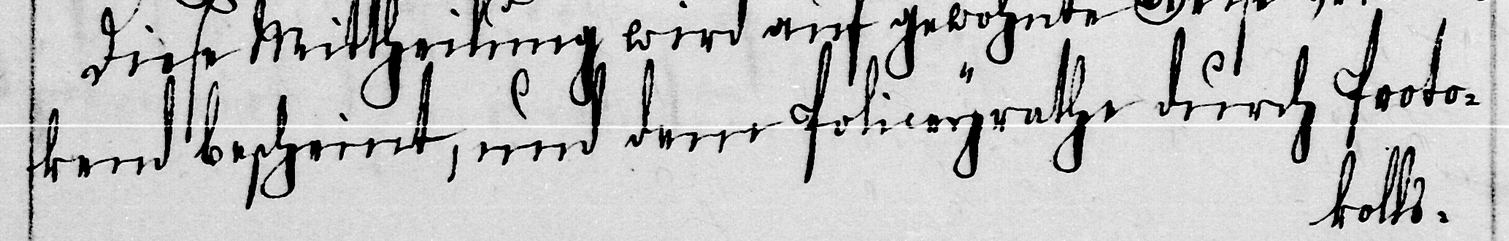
kend bescheint, und dem Policeyrathe durch Proto-
